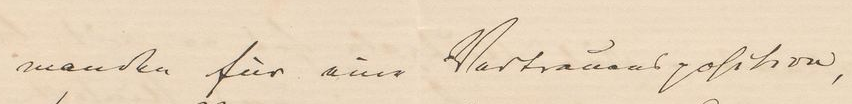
manden für eine Vertrauensposition,
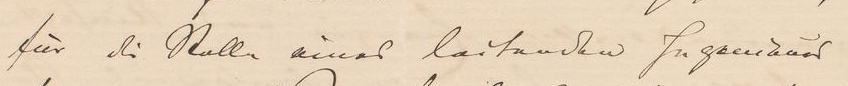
für die Stelle eines leitenden Ingenieurs
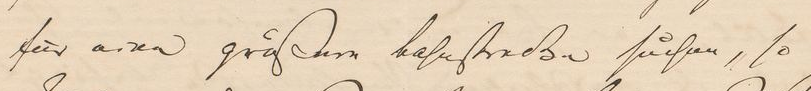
für eine größere Bahnstrecke suchen, so
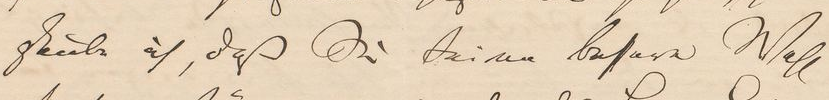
glaube ich, daß Sie keine bessere Wahl
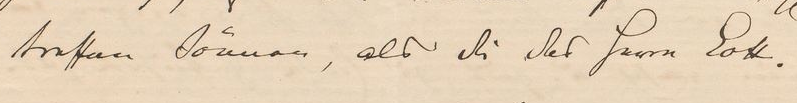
treffen können, als die des Herrn Lott.
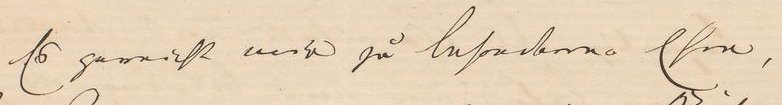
Es gereicht mir zu besonderer Ehre,
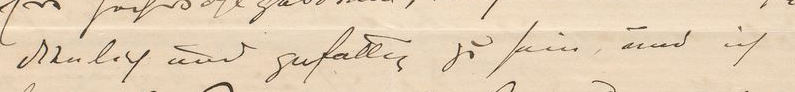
dienlich und gefällig zu sein, und ich
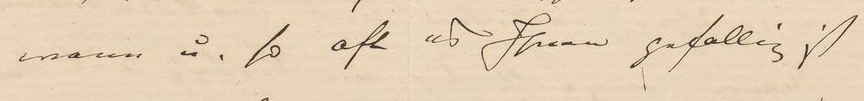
wenn u. so oft es Ihnen gefällig ist.
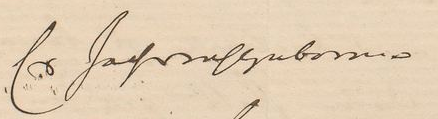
Ew Hochwohlgeboren
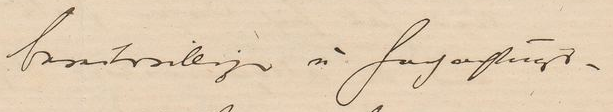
bereitwillig u hochachtungs-
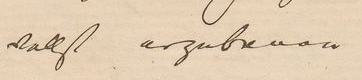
vollst ergebener
